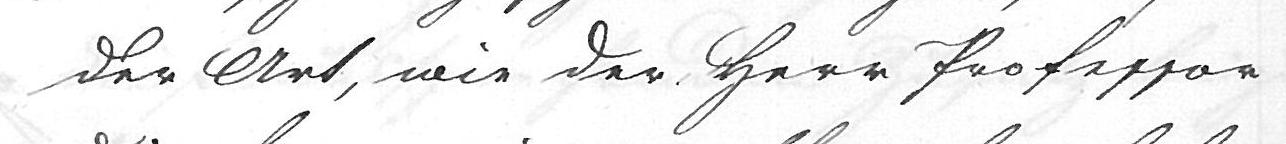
der Art, wie der Herr Professor
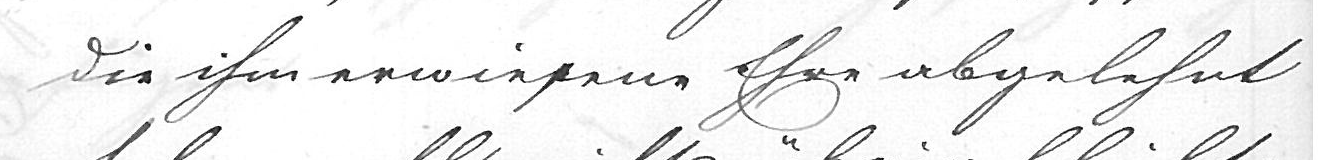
die ihm erwiesene Ehre abgelehnt
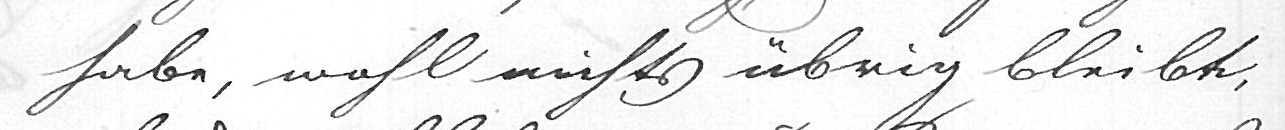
habe, wohl nichts übrig bleibt,
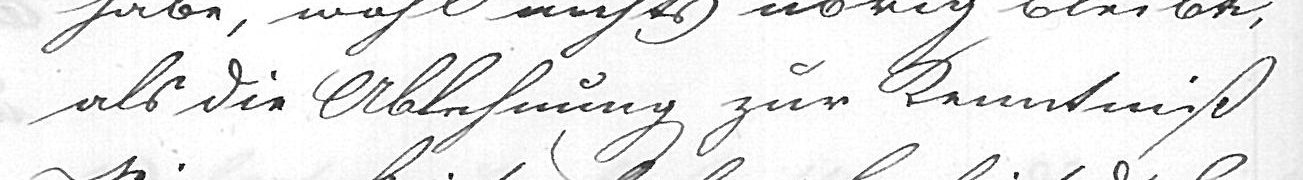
als die Ablehnung zur Kenntniß
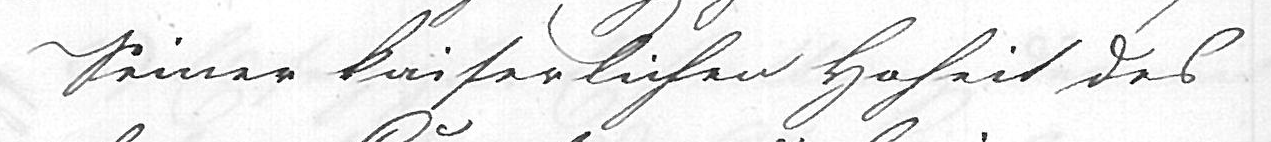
Seiner kaiserliche Hoheit des
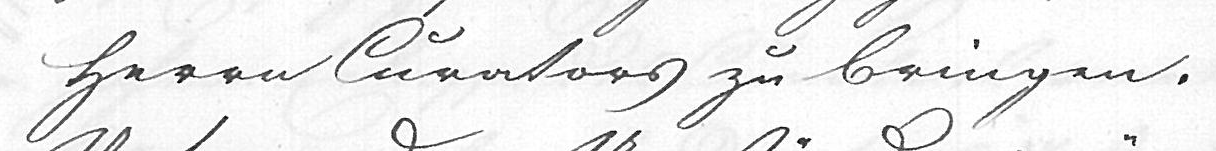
Herrn Curators zu bringen.
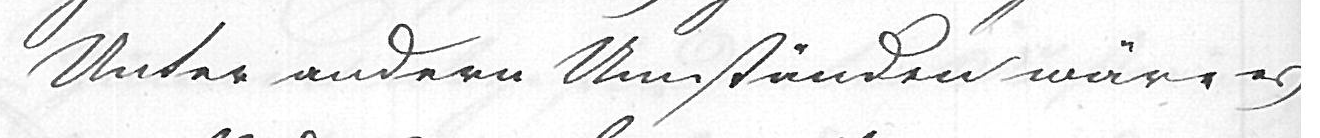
Unter andern Umständen wäre es
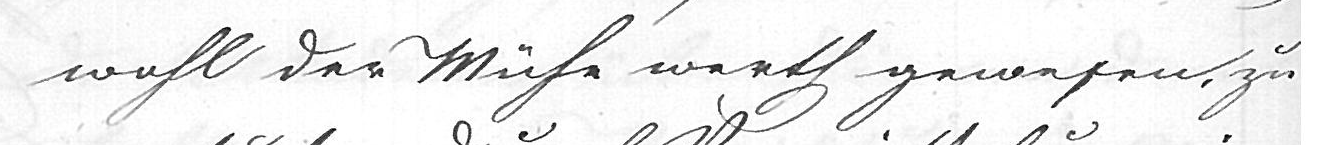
wohl der Mühe werth gewesen, zu
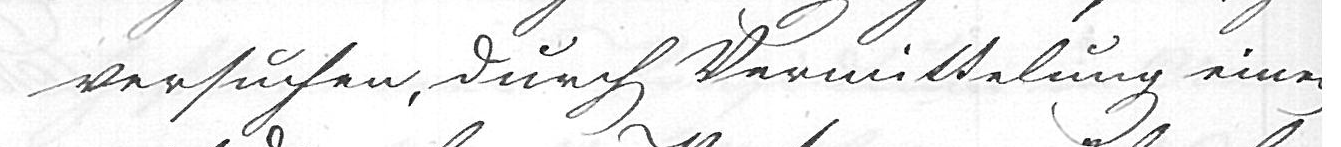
versuchen, durch Vermittelung eines
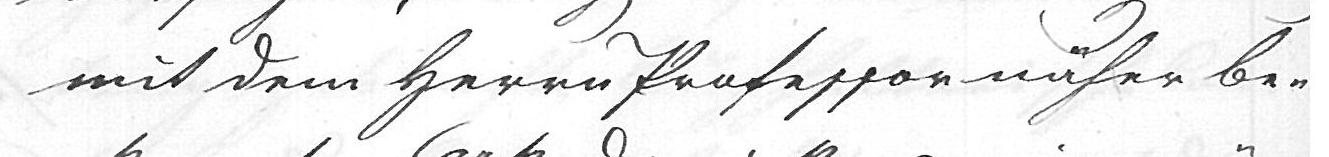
mit dem Herrn professor näher be-
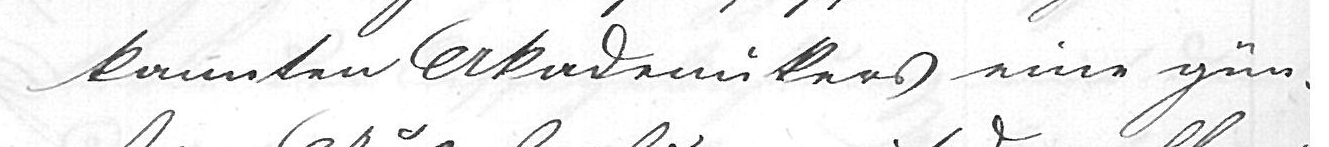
kannten Akademikers eine gün-
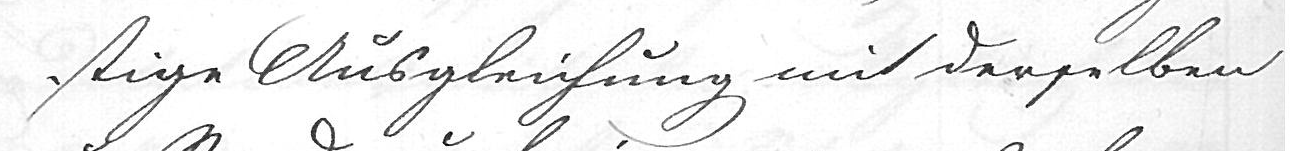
stige Ausgleichung mit derselben
